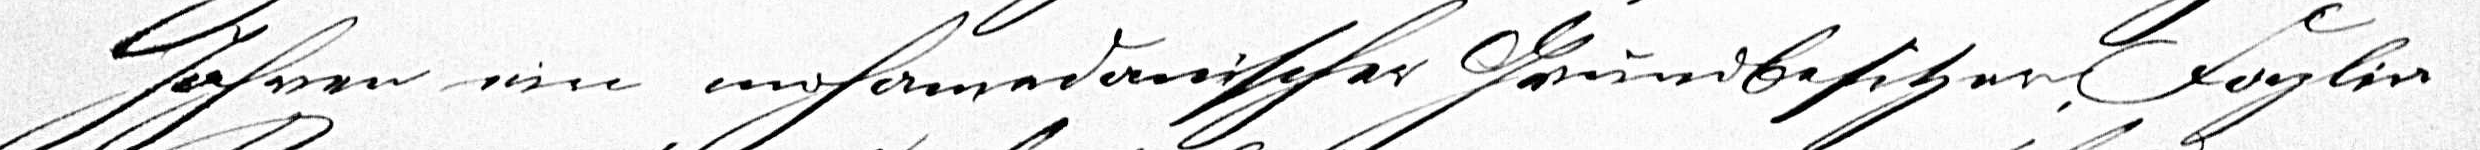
Jahren ein mohamedanischer Grundbesitzer, Foylia
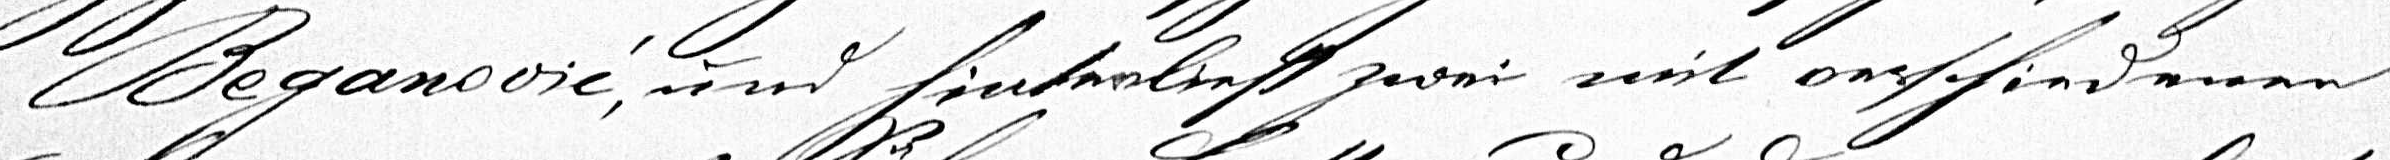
Beganović, und hinterließ zwei mit orschiedenen
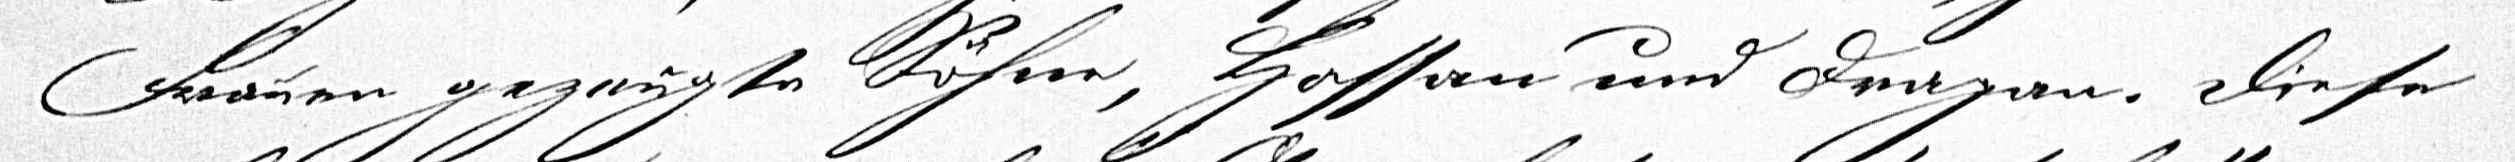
Frauen gezeugte Söhne, Hassan und Dragan. Diese
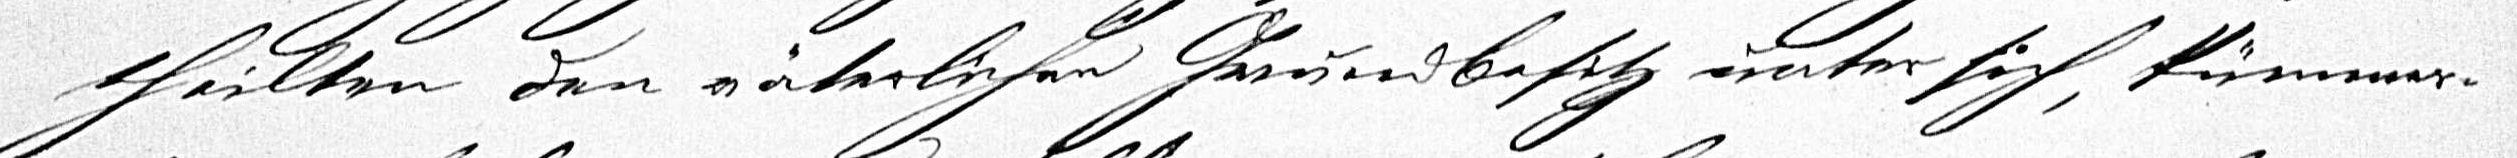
theilten den väterlichen Grundbesitz unter sich, kümmer¬
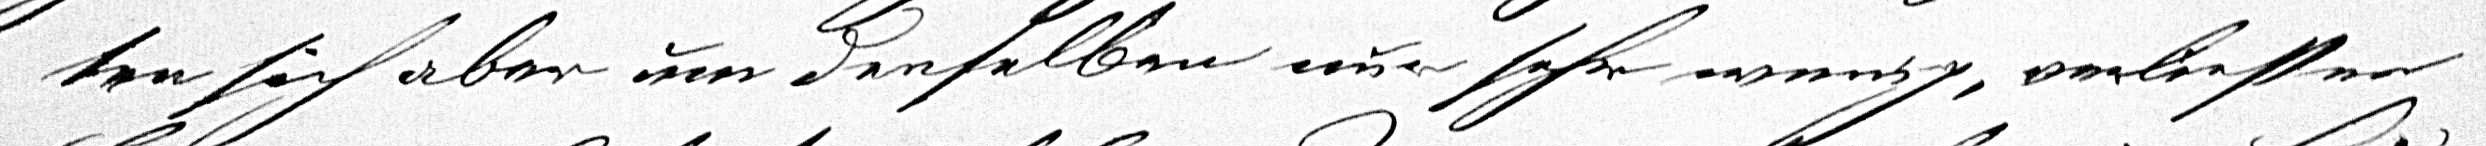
ten sich aber um denselben nur sehr wenig, verließen
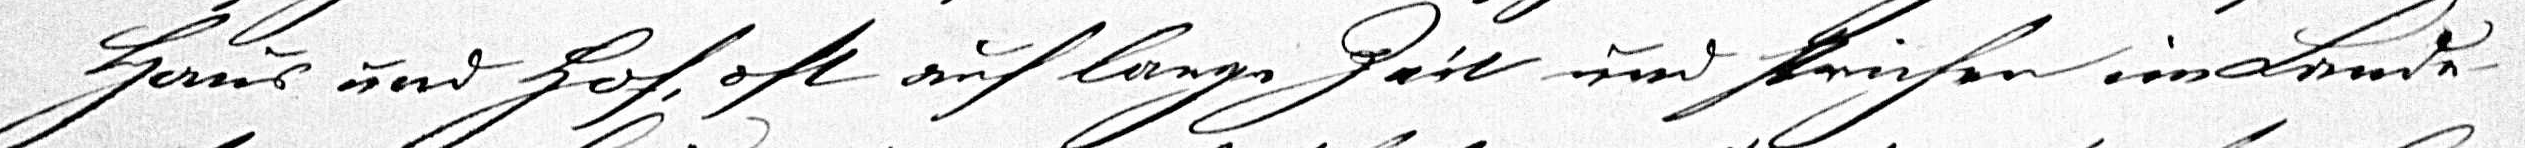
Haus und Hof, oft auf lange Zeit und strichen im Lande¬
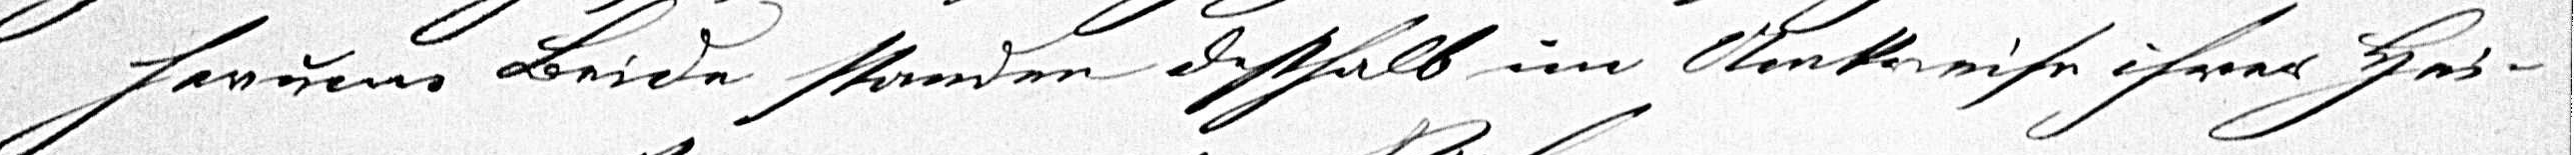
herums Beide standen deßhalb im Umkreise ihrer Hei¬
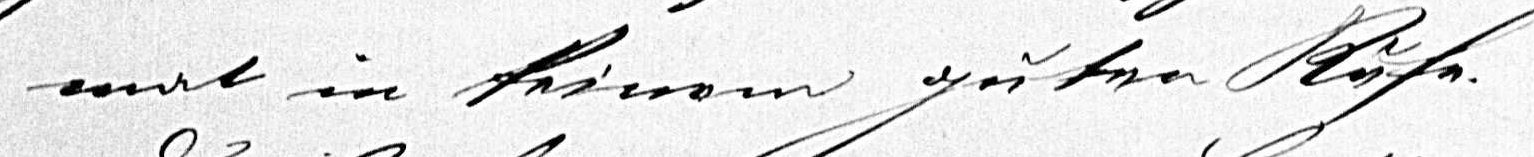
mat in keinem guten Rufe.
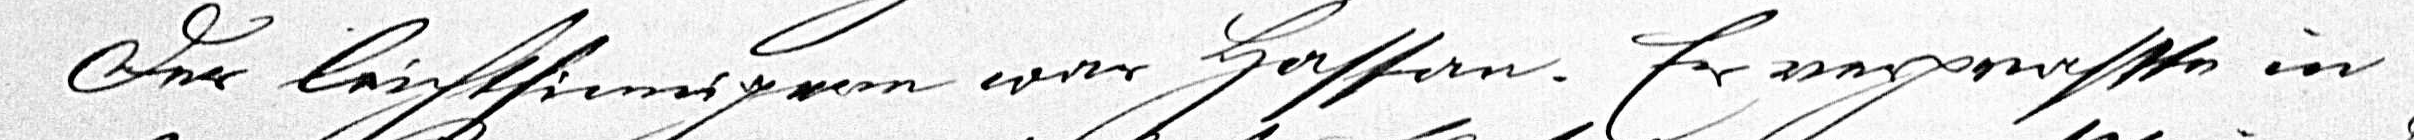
Der Leichtsinns gern war Hassan. Er verpraßte in
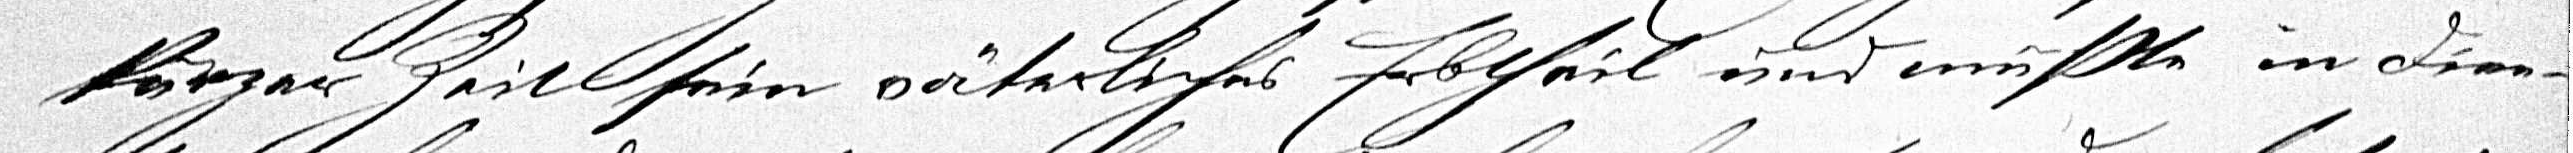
kurzer Zeit sein väterliches Erbtheil und mußte in dien¬
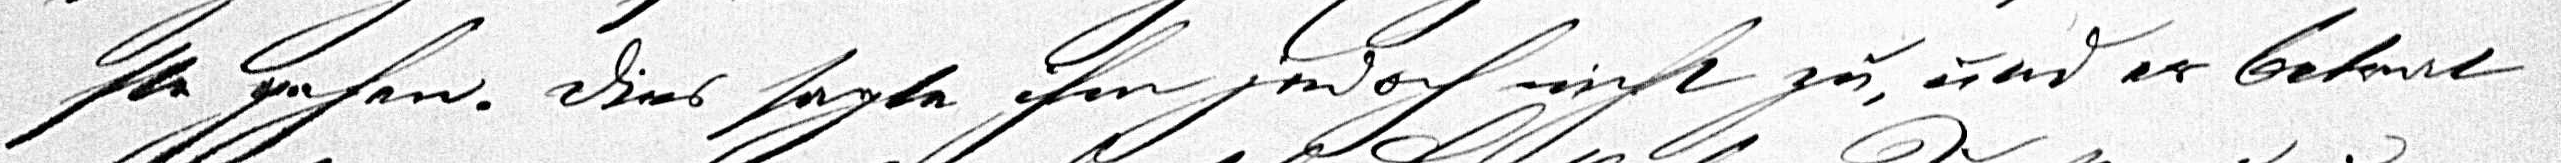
ste gehen. Dies sagte ihm jedoch nicht zu, und er betrat
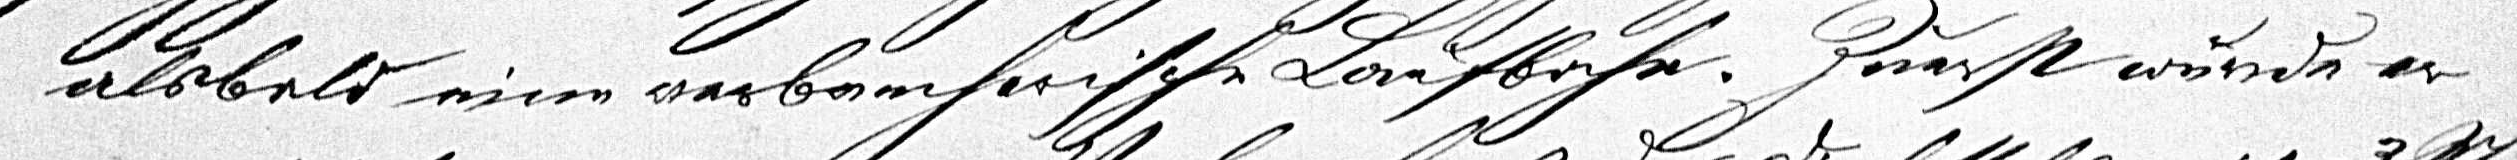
alsbald eine verbrecherische Laufbahn. Zuerst wurde er
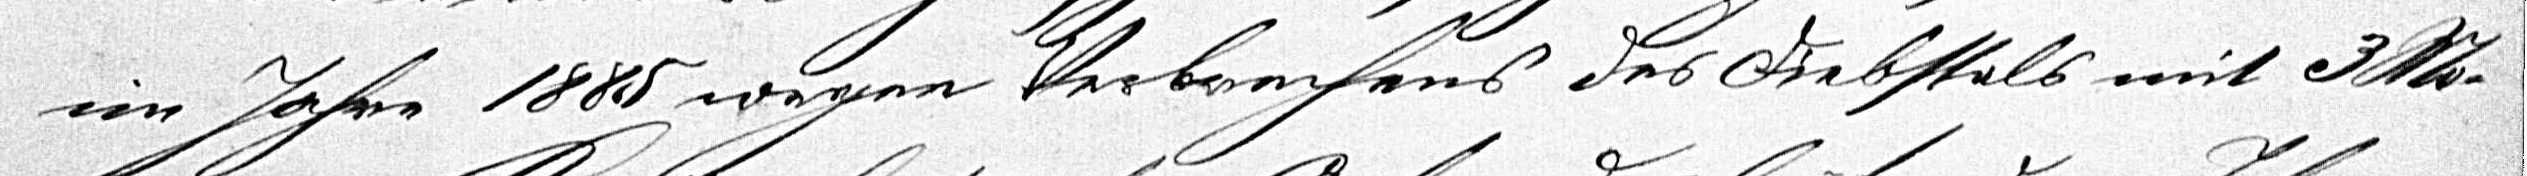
im Jahre 1885 wegen Verbrechens des Diebstals mit 3 Mo¬
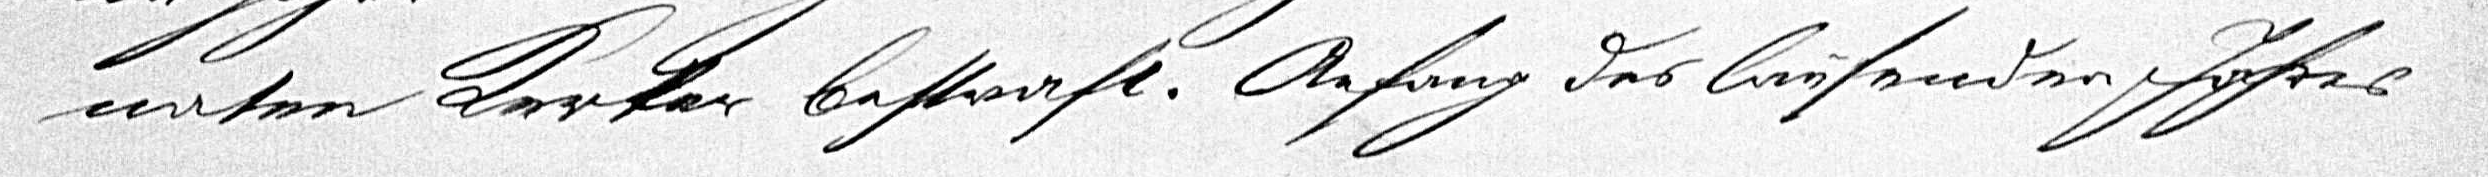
naten Kerker bestraft. Anfang des lausenden Jahres
